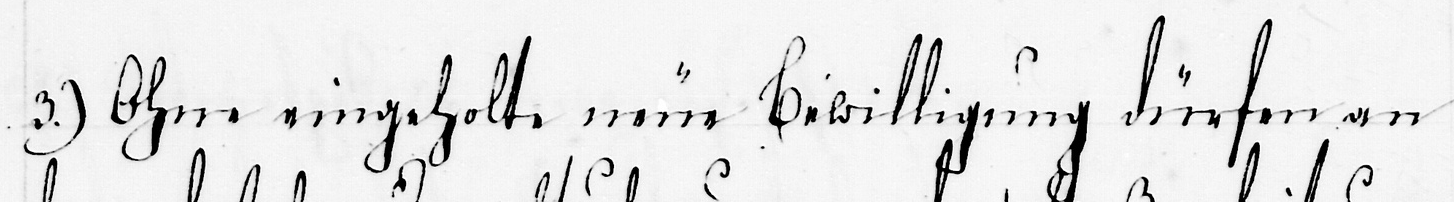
3.) Ohne eingeholte neue Bewilligung dürfen an
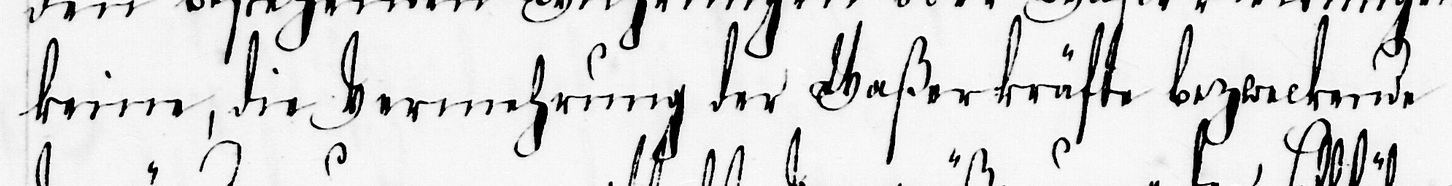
keine, die Vermehrung der Waßerkräfte bezweckende
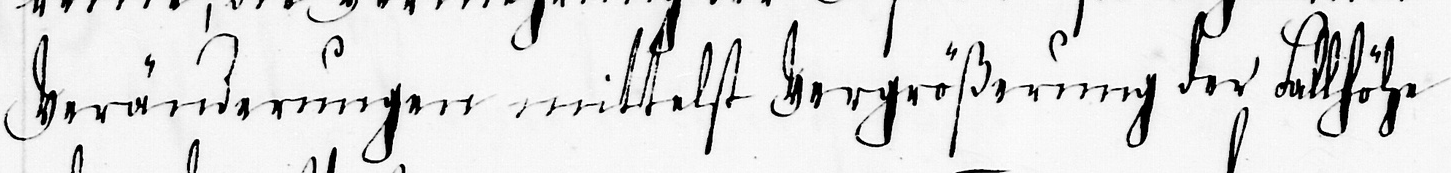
Veränderungen mittelst Vergrößerung der Fallhöhe
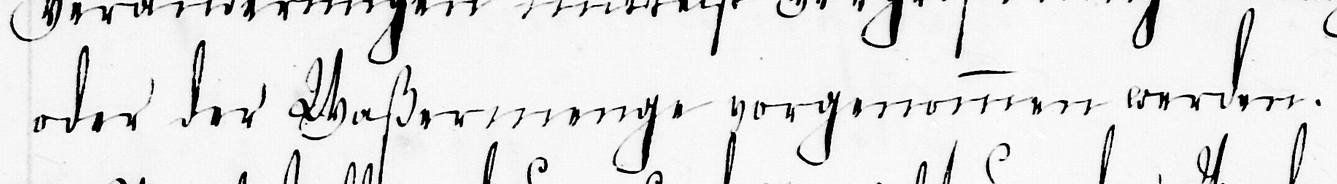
oder der Waßermenge vorgenommen werden.
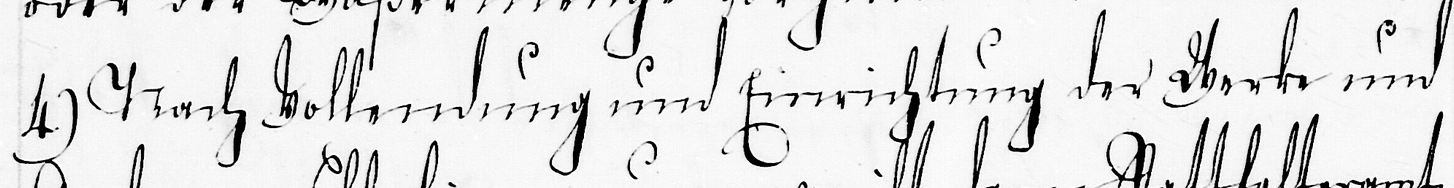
4.) Nach Vollendung und Einrichtung der Werke und
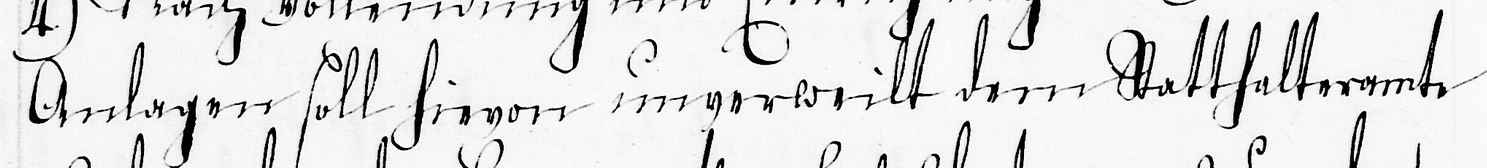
Anlagen soll hievon unverweilt dem Statthalteramte
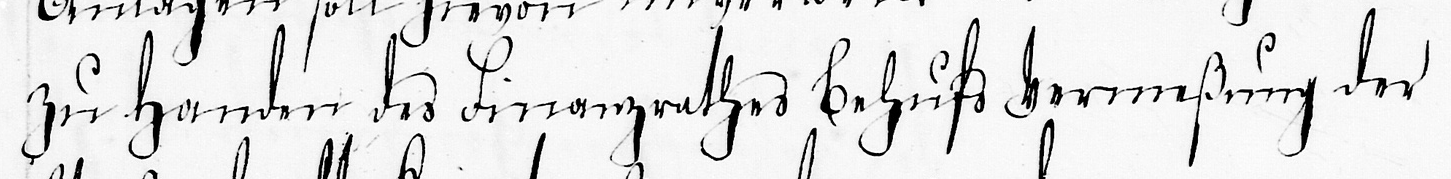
zu Handen des Finanzrathes Behufs Vermeßung der
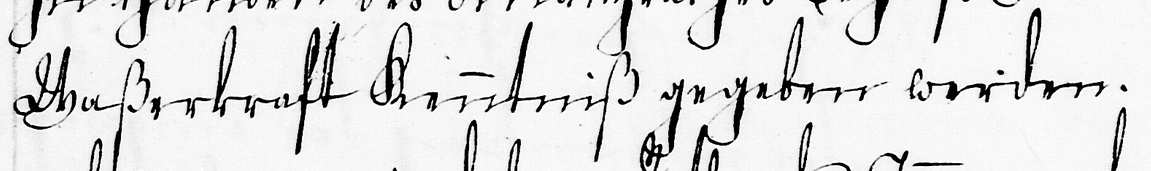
Waßerkraft Kenntniß gegeben werden.
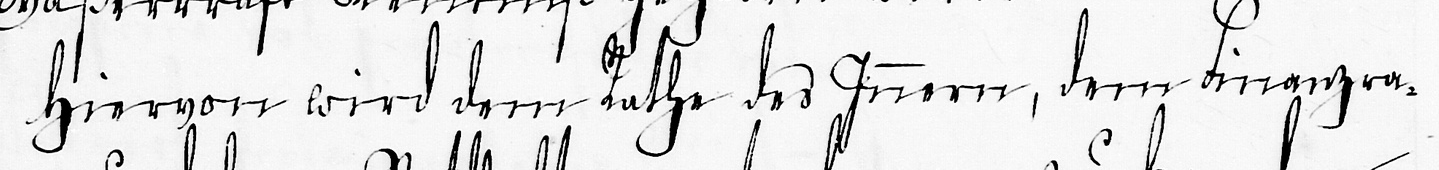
Hiervon wird dem Rathe des Innern, dem Finanzra¬
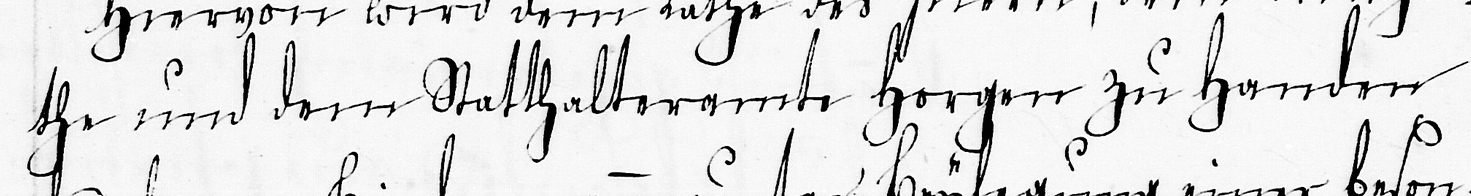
the und dem Statthalteramte Horgen zu Handen
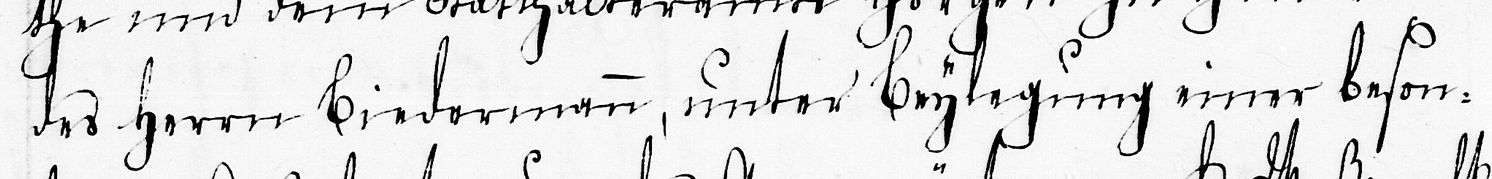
des Herrn Biedermann, unter Beylegung einer beson¬
